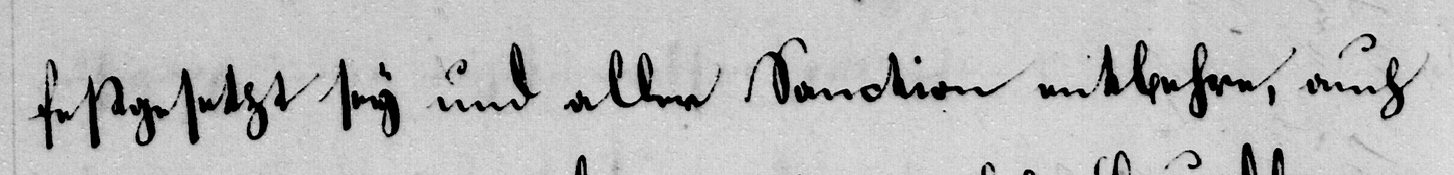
festgesetzt sey und aller Sanction entbehre, auch
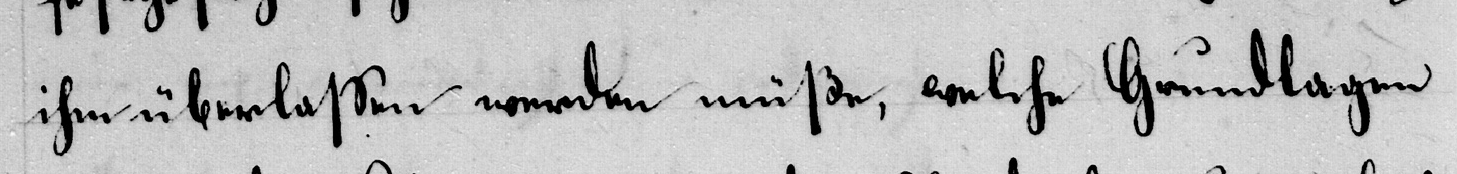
ihm überlaßen werden müße, welche Grundlagen
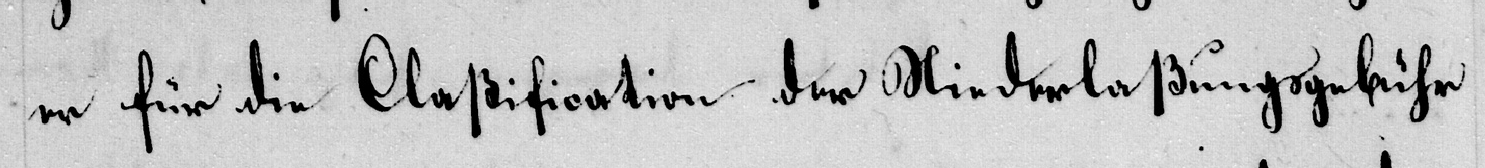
er für die Claßification der Niederlaßungsgebühr
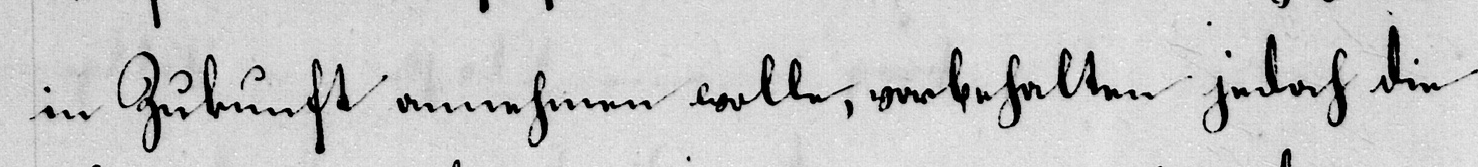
in Zukunft annehmen wolle, vorbehalten jedoch die
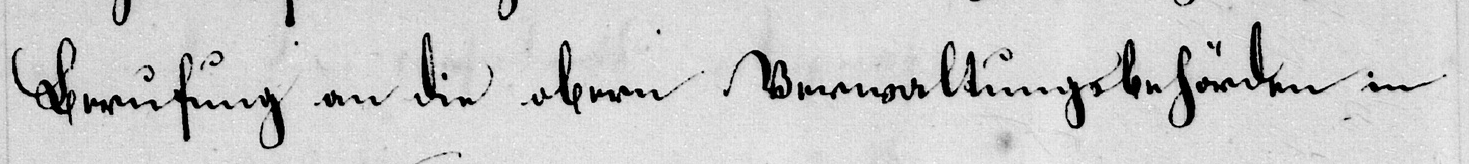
Berufung an die obern Verwaltungsbehörden in
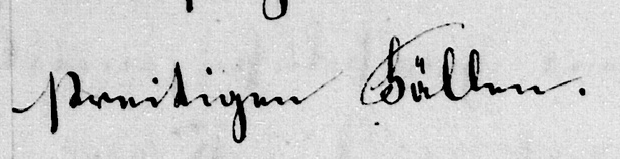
streitigen Fällen.
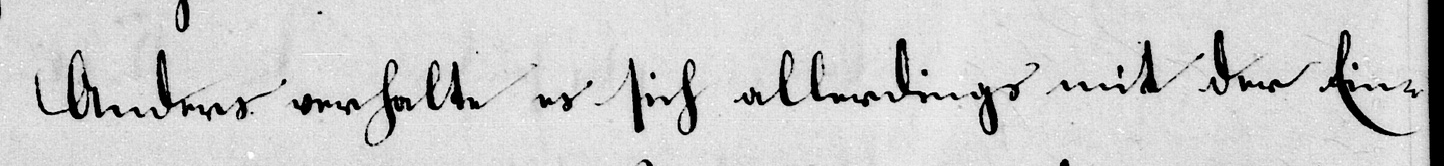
Anders verhalte es sich allerdings mit der Ein¬
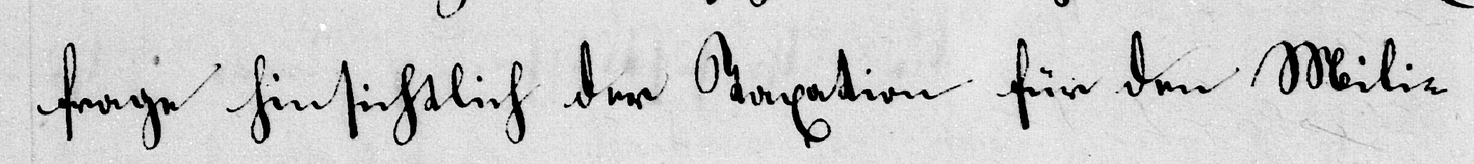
frage hinsichtlich der Taxation für den Mili¬
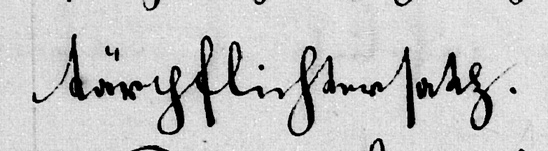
tärpflichtersatz.
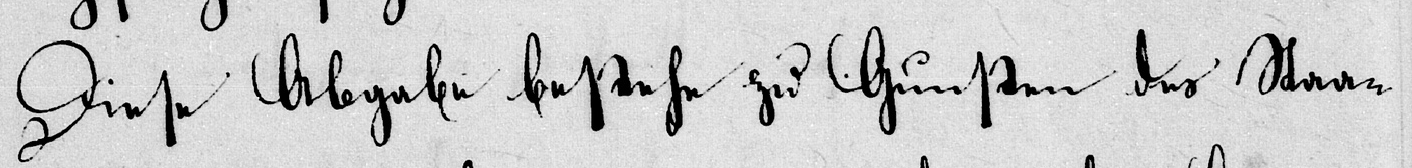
Diese Abgabe bestehe zu Gunsten des Staa¬
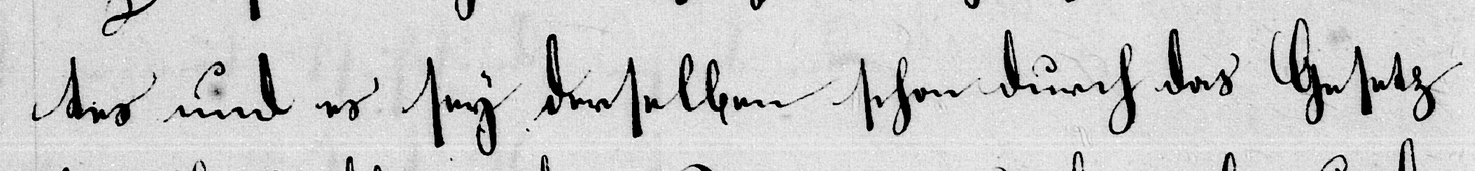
tes und es sey derselben schon durch das Gesetz
